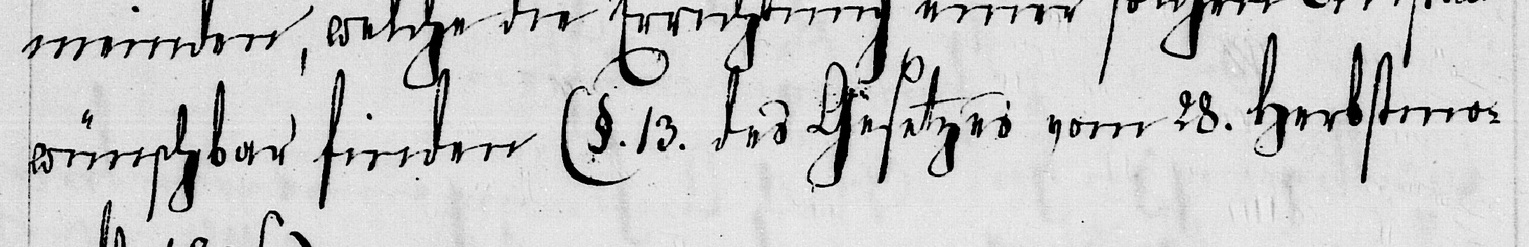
wünschbar finden (§. 13. des Gesetzes vom 28. Herbstmo¬
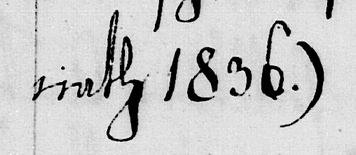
nath 1836.)
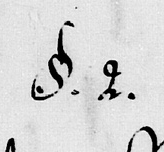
§. 2.
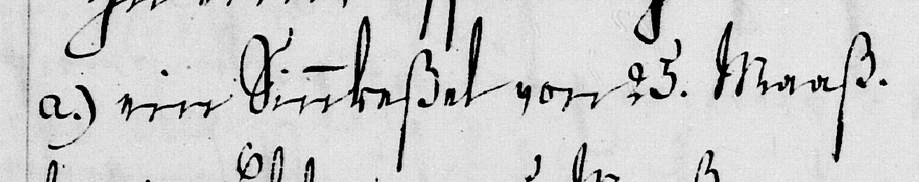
a.) ein Sinnkeßel von 25. Maaß.
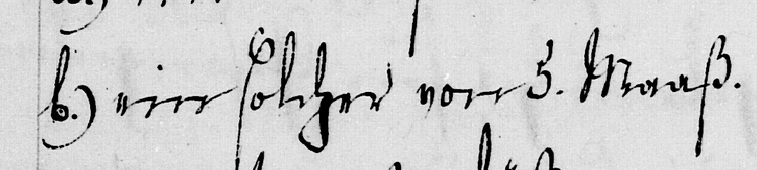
b.) ein solcher von 5. Maaß.
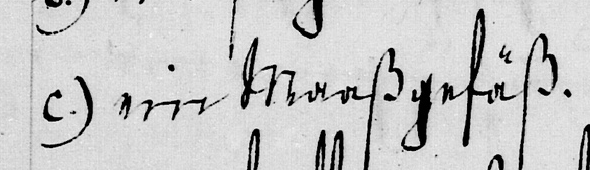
c.) ein Maaßgefäß.
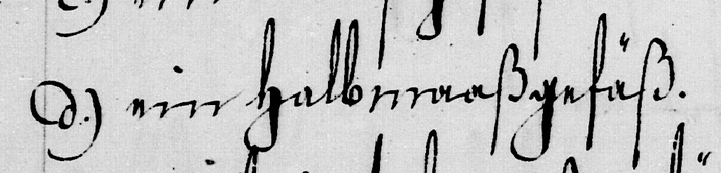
d.) ein Halbmaaßgefäß.
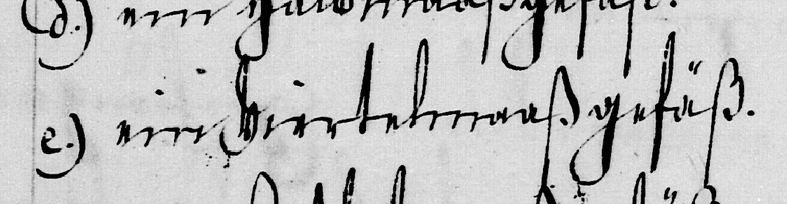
e.) ein Viertelmaaßgefäß.
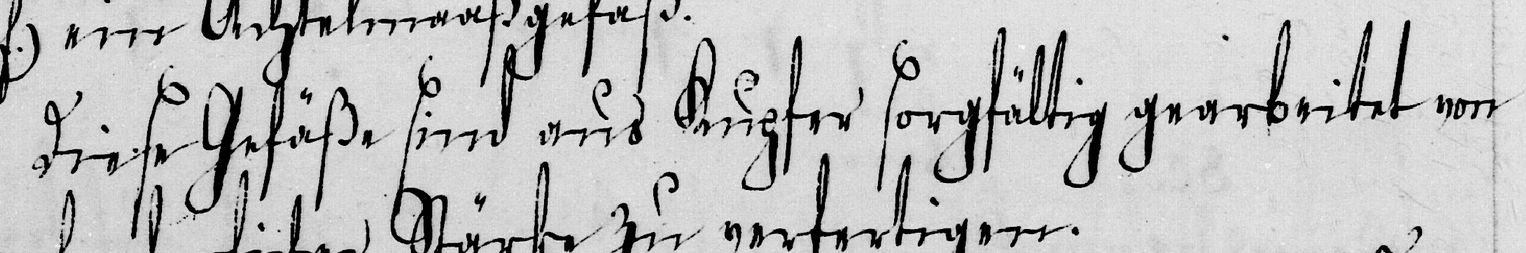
Diese Gefäße sind aus Kupfer sorgfältig gearbeitet von
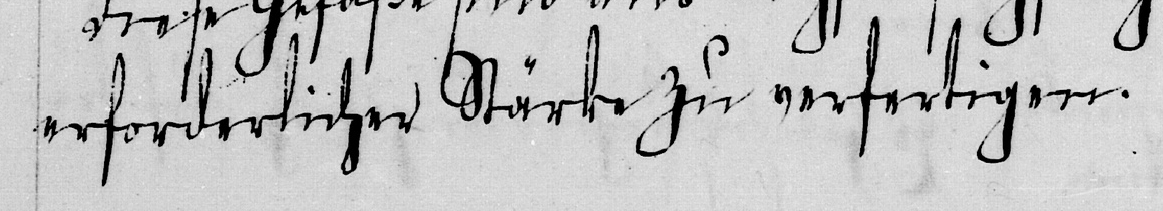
erforderlicher Stärke zu verfertigen.
